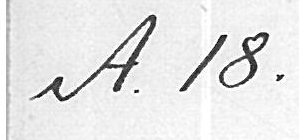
A. 18.
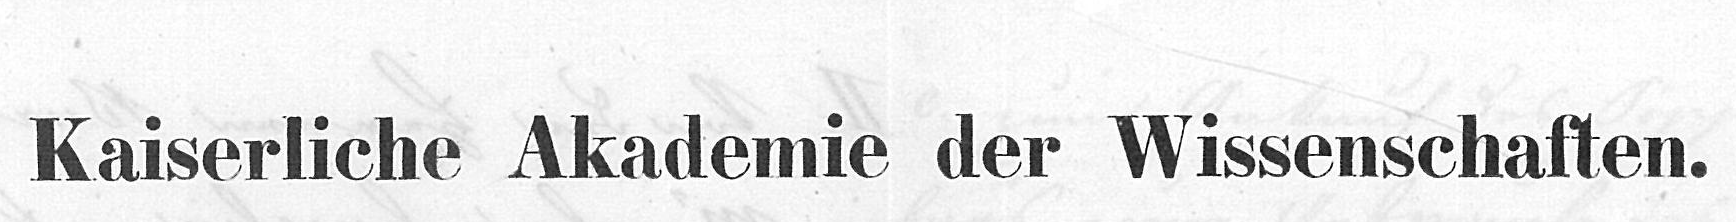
Kaiserliche Akademie der Wissenschaften.
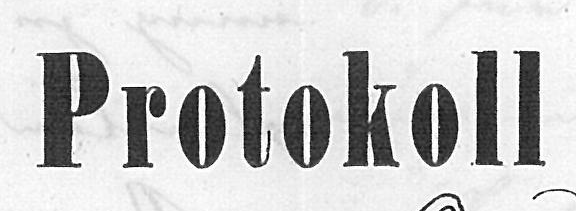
Protokoll
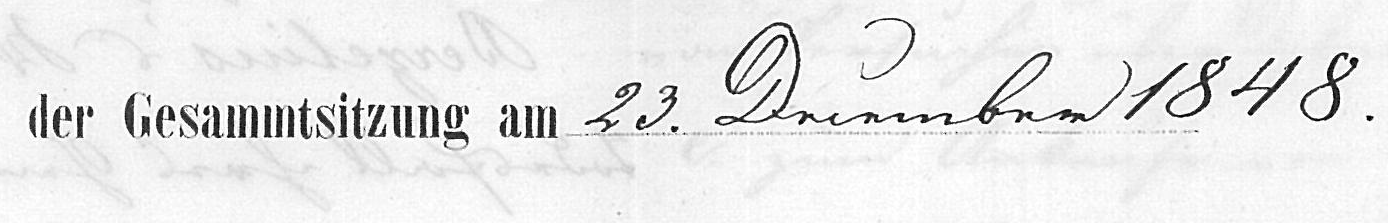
der Gesammtsitzung am 23. December 1848.
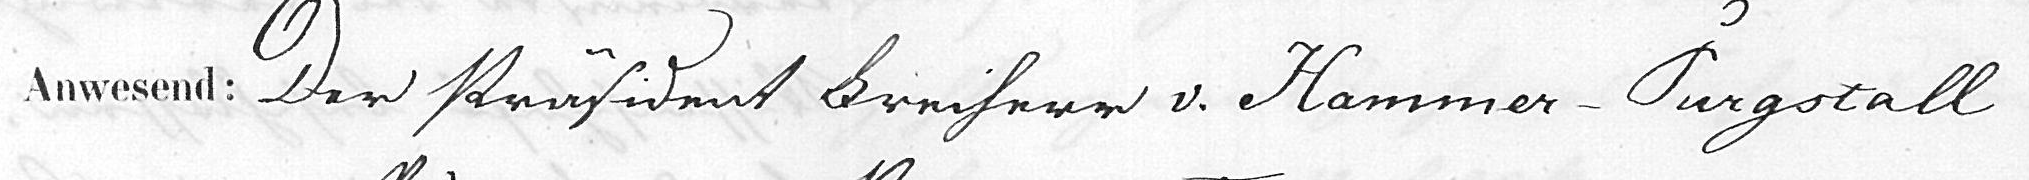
Anwesend: Der Präsident Freiherr v. Hammer-Purgstall
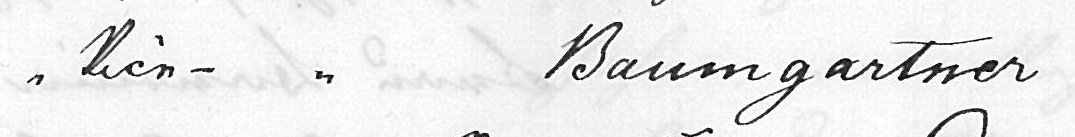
" Vice-" Baumgartner
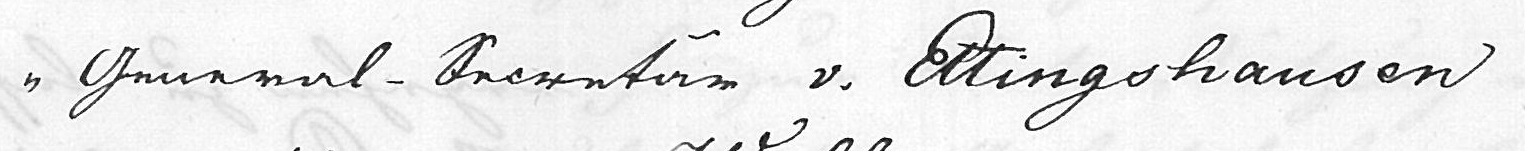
"General- Secretär v. Ettingshausen
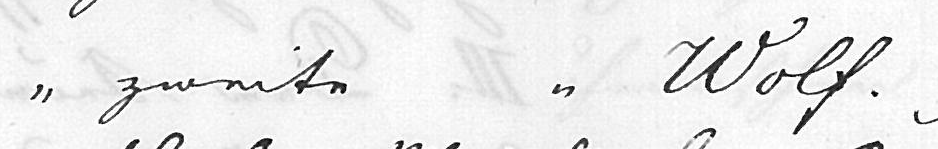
" zweite " Wolf.
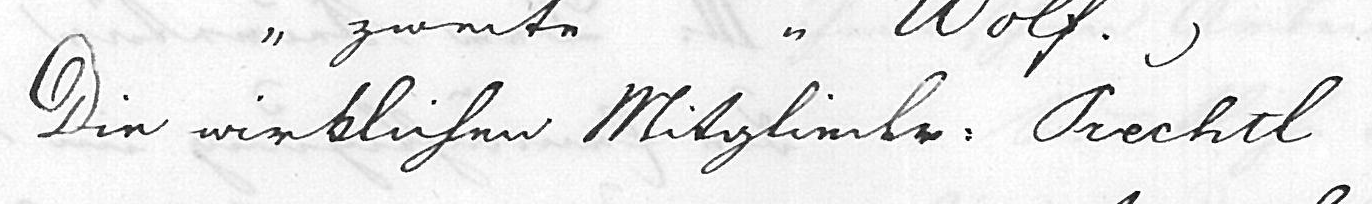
Die wirklichen Mitglieder: Prechtl
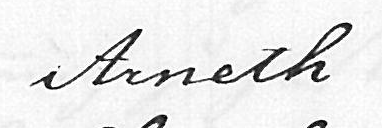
Arneth
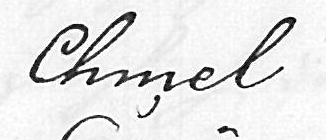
Chmel
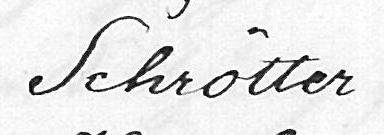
Schrötter
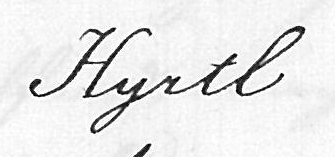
Hyrtl
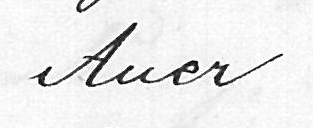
Auer
